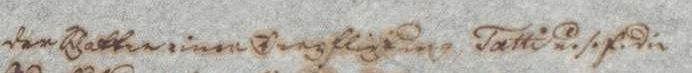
der Schatten einer Verpflichtung, Tatti u. s. f. die
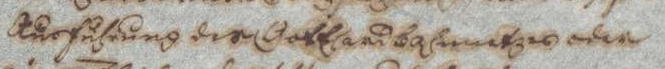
Ausführung des Gotthardbahnnetzes oder
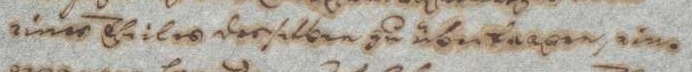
eines Theiles desselben zu übertragen, ein-
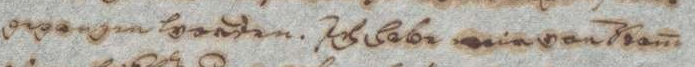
gegangen worden. Ich habe mir von Stamm
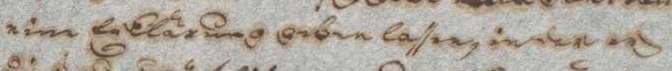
eine Erklärung geben lassen, in der er
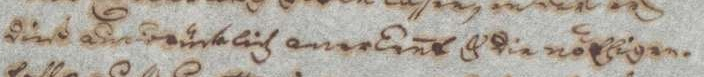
dieß ausdrücklich anerkennt & die nöthigen-
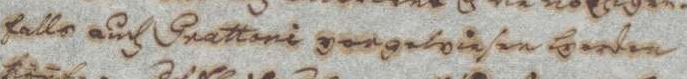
falls auch Grattoni vorgewiesen werden
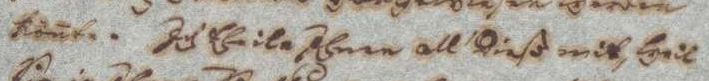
könnte. Ich theile Ihnen all' dieß mit, weil
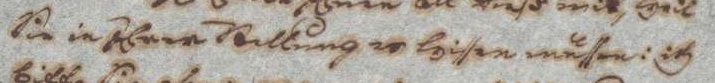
Sie in Ihrer Stellung es wissen müssen; ich
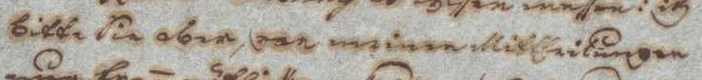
bitte Sie aber, von meinen Mittheilungen
